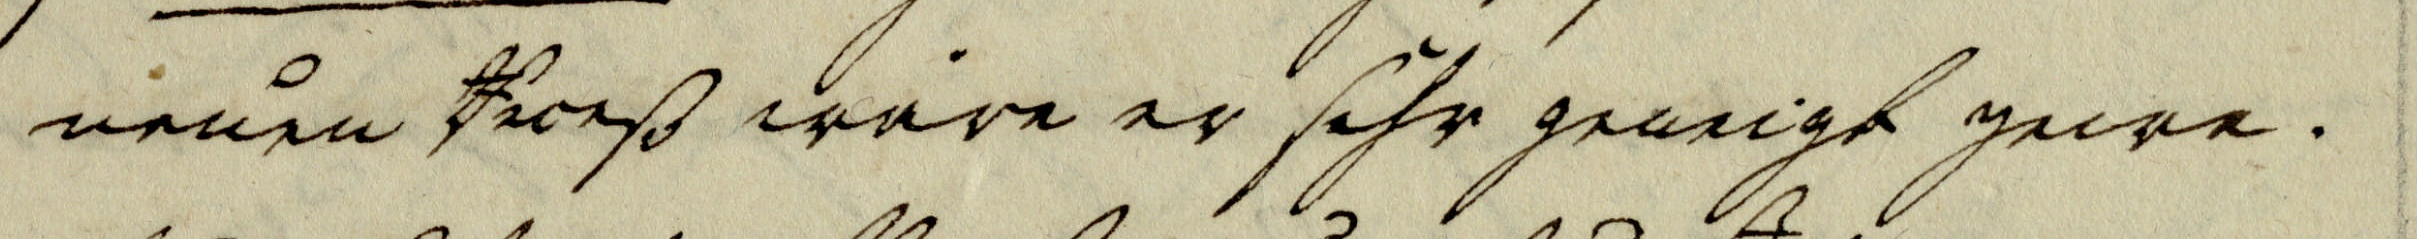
neuen Receß wäre er sehr geneigt gewe¬
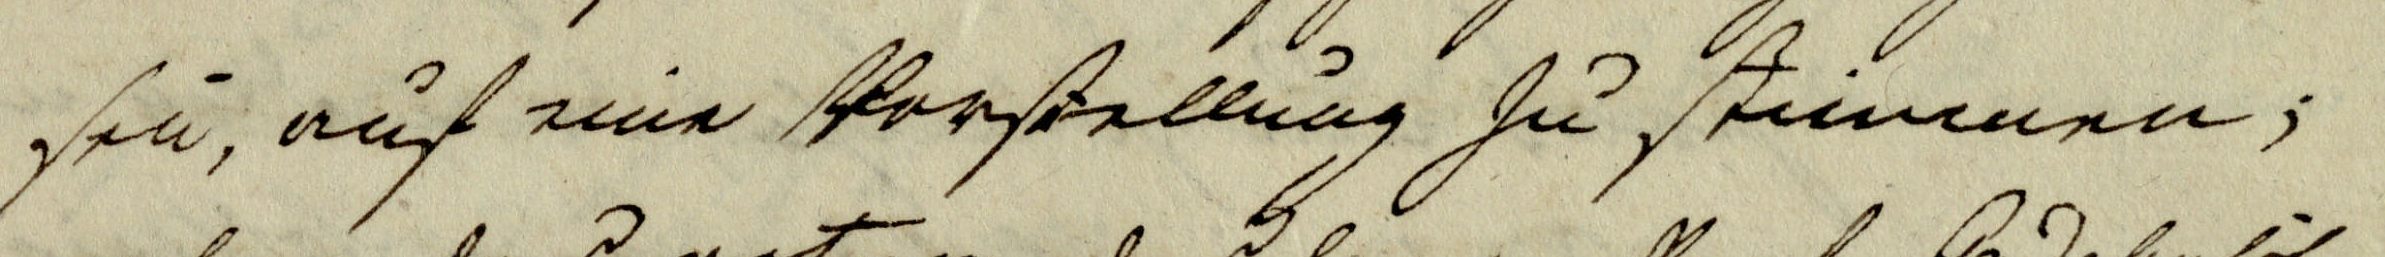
sen, auf eine Vorstellung zu stimmen;
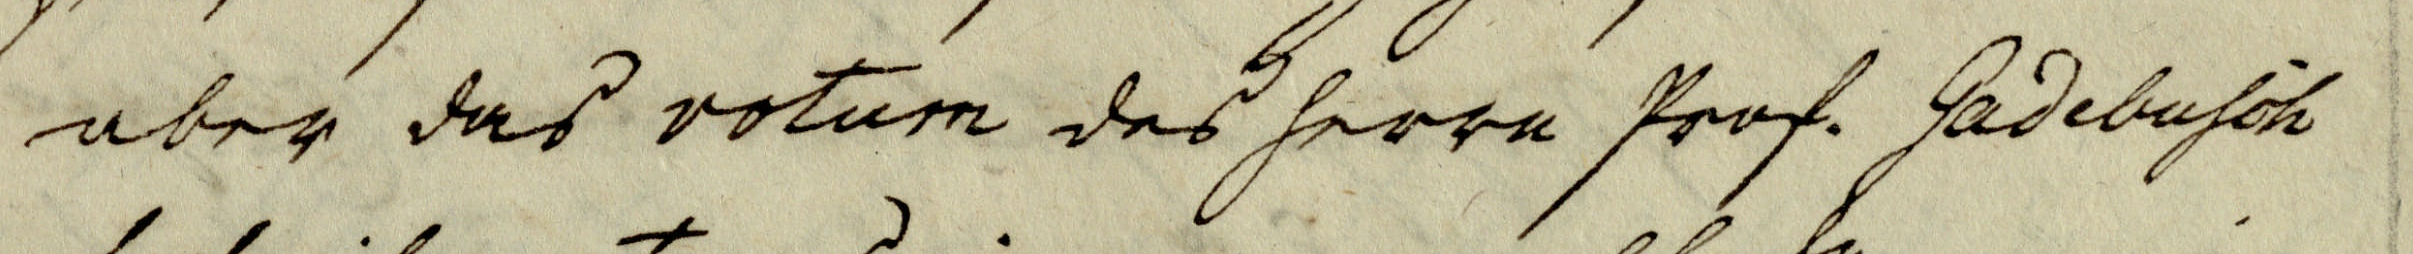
aber das votum des Herrn Prof. Gadebusch
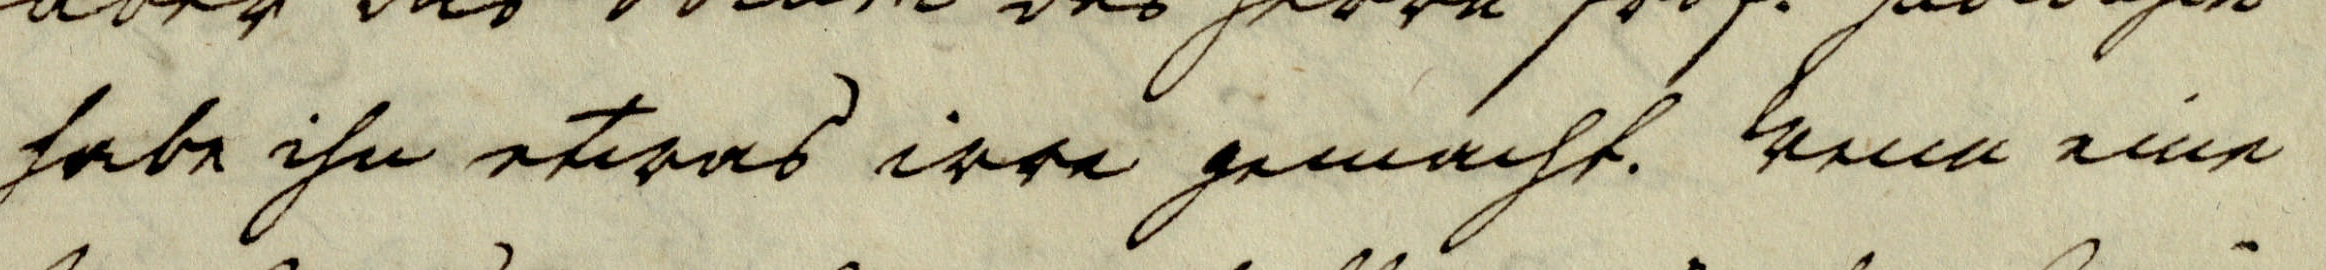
habe ihn etwas irre gemacht. Wenn eine
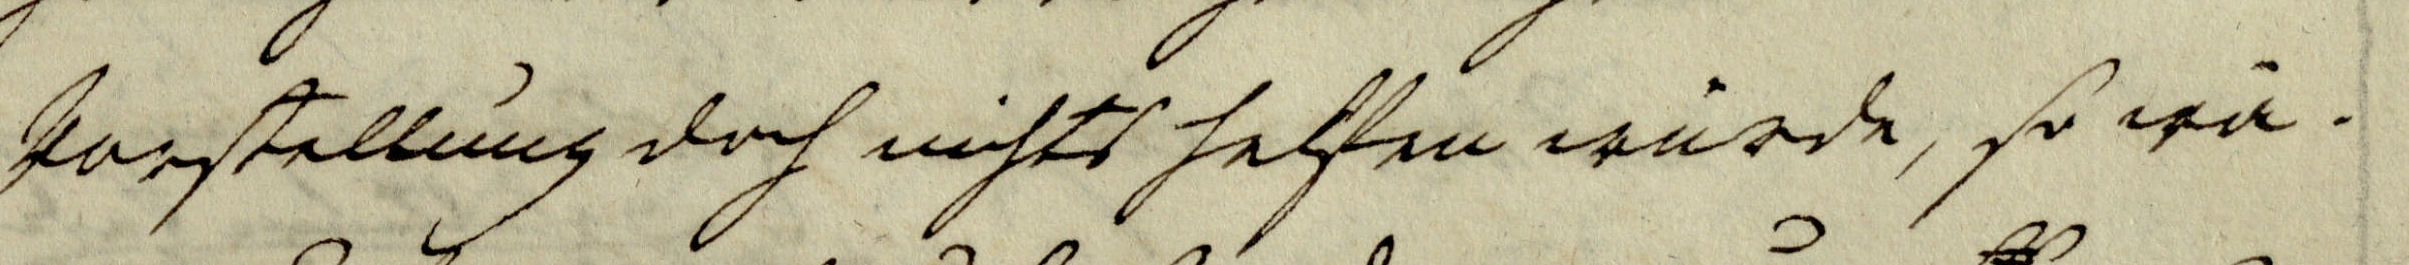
Vorstellung doch nichts helfen würde, so wä¬
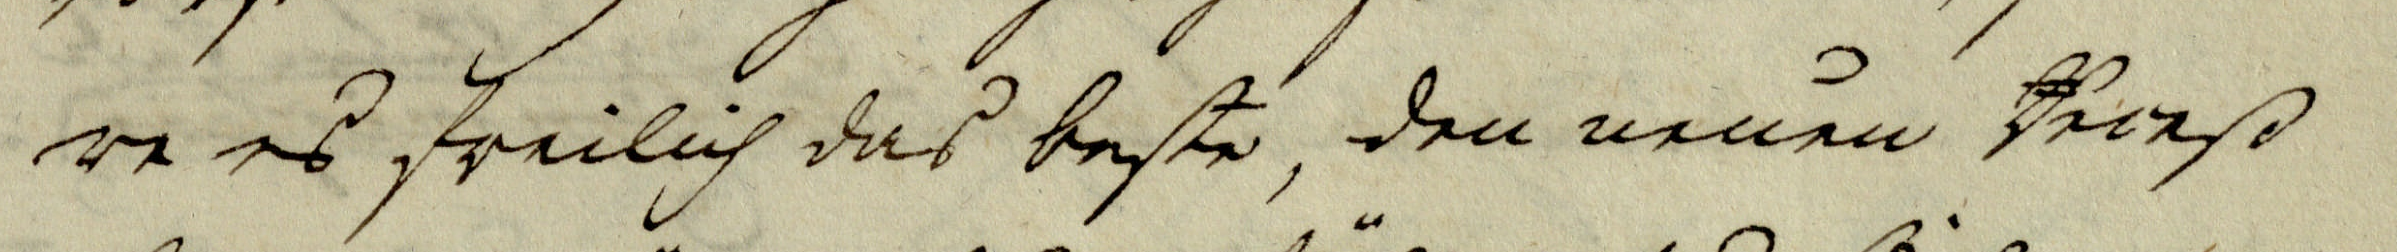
re es freilich das beste, den neuen Receß
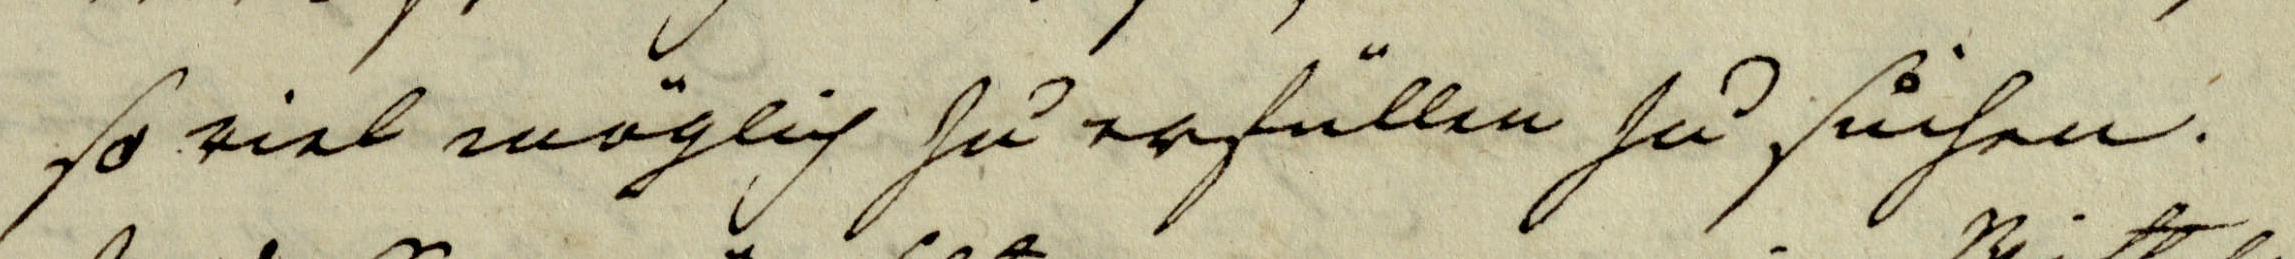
so viel möglich zu erfüllen zu suchen.
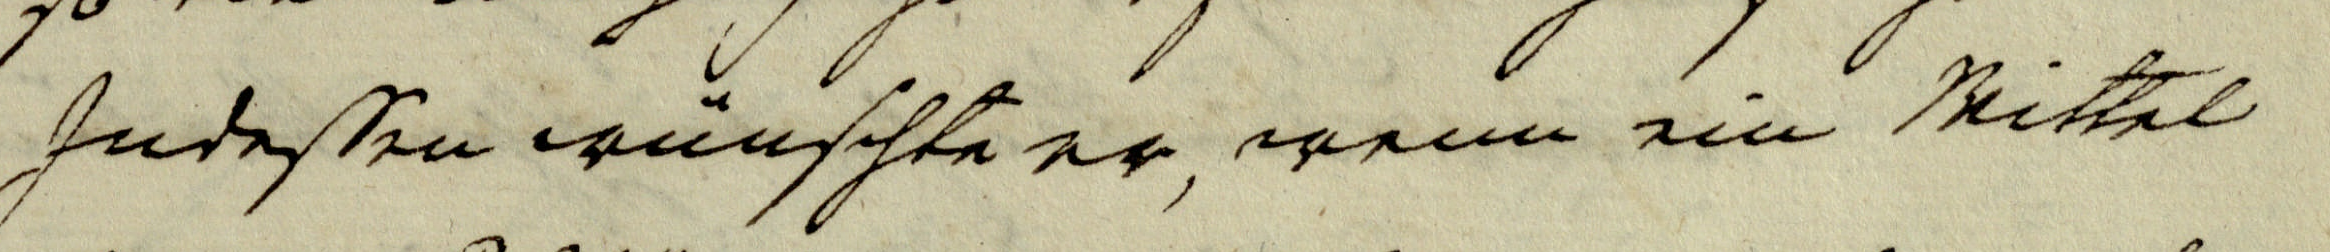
Indessen wünschte er, wenn ein Mittel
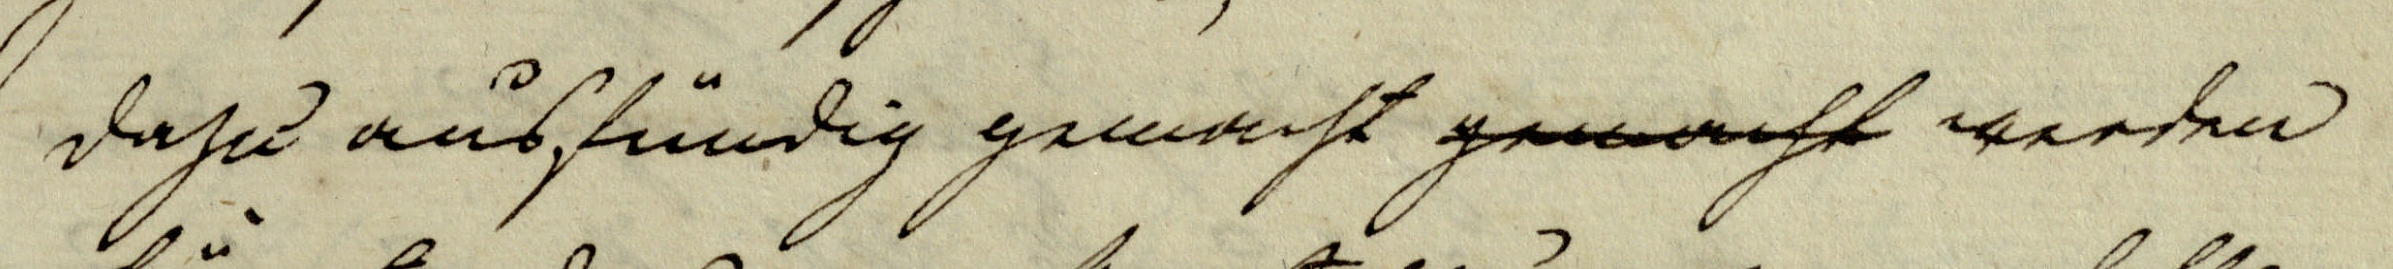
dazu ausfündig gemacht gemacht werden
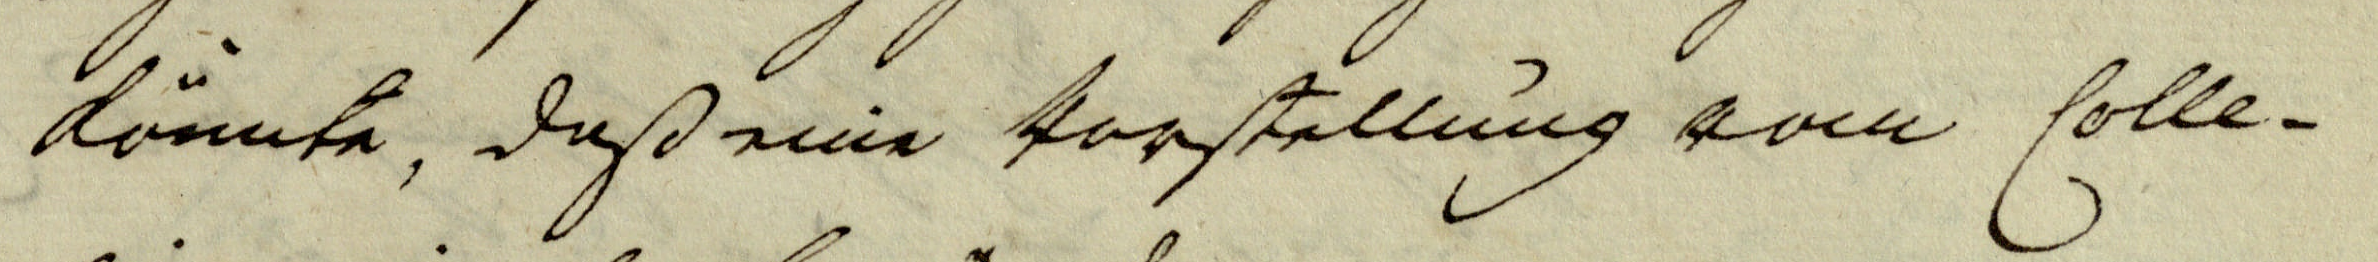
könnte, daß eine Vorstellung vom Colle¬
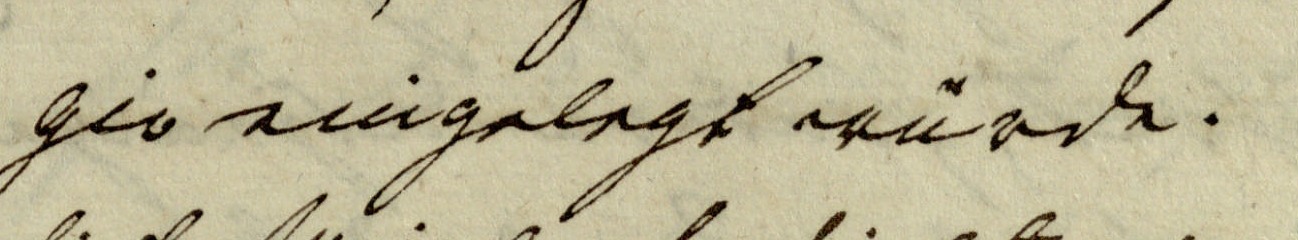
gio eingelegt würde.
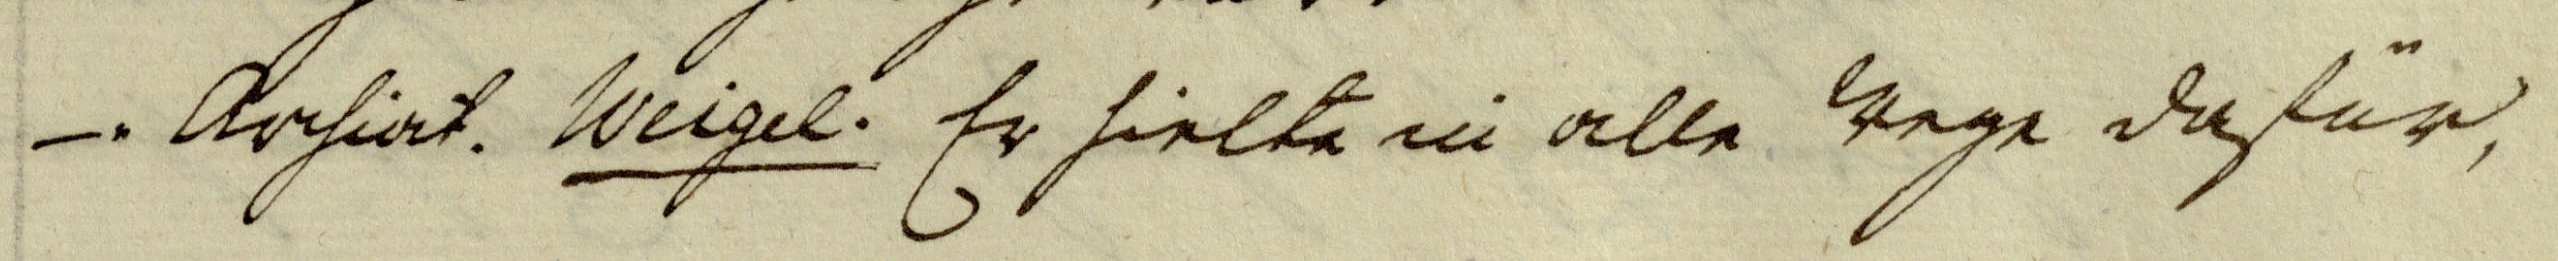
Archiat. Weigel. Er hielte in alle Wege dafür,
